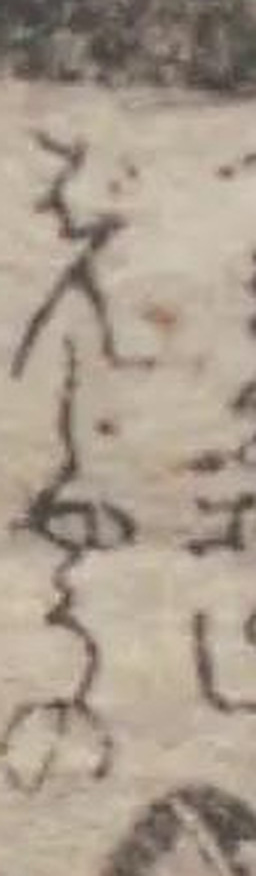ばんじやうの
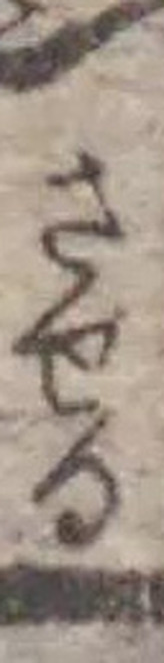させる
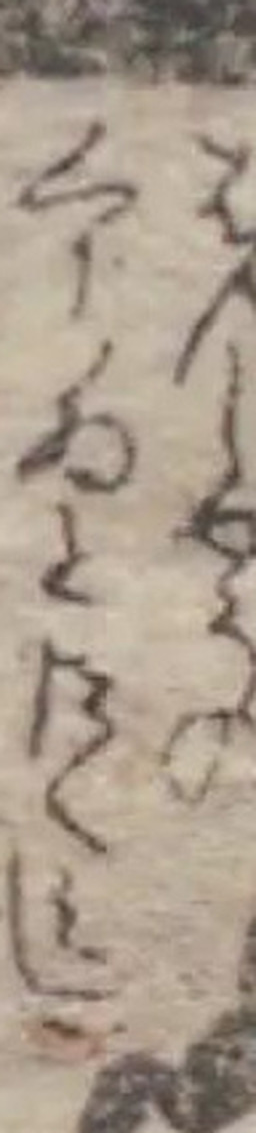くらゐとたくみし
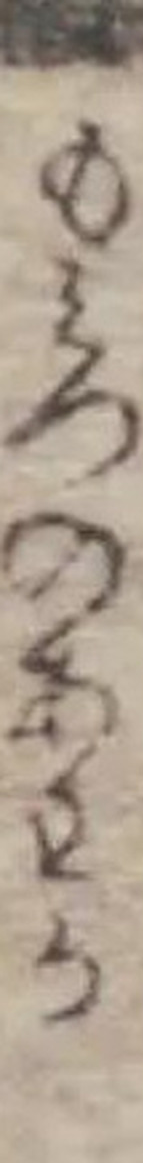もみつのあわか
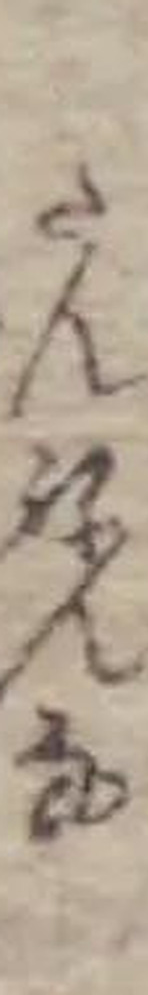たんねんな
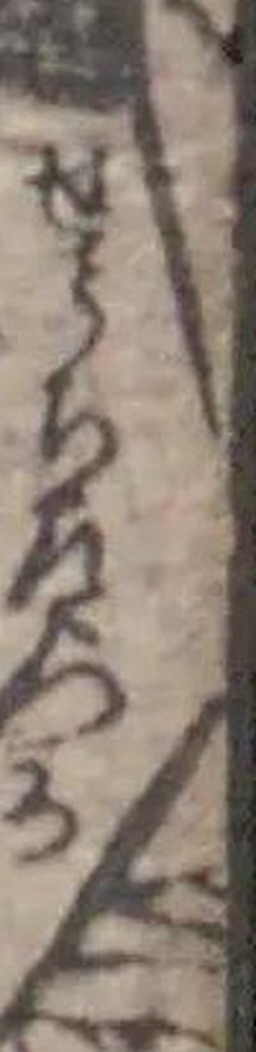せうち左エ門か
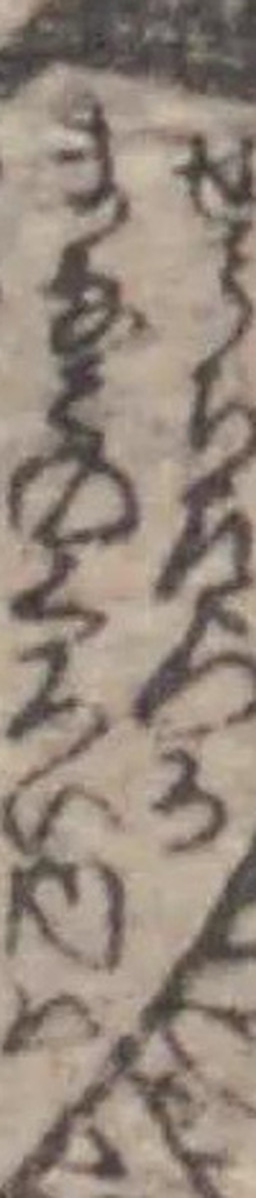まなこのくろい内は
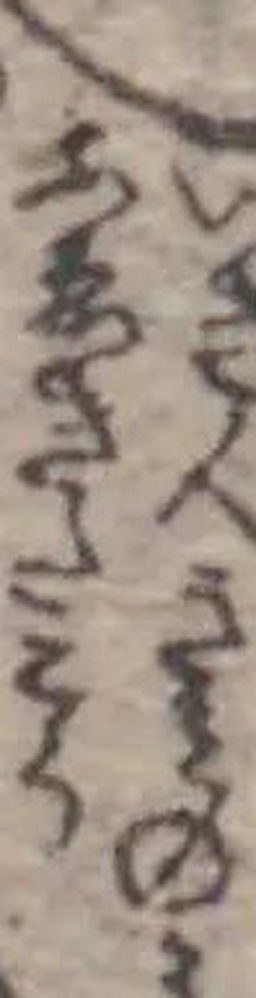ふゑきたこう
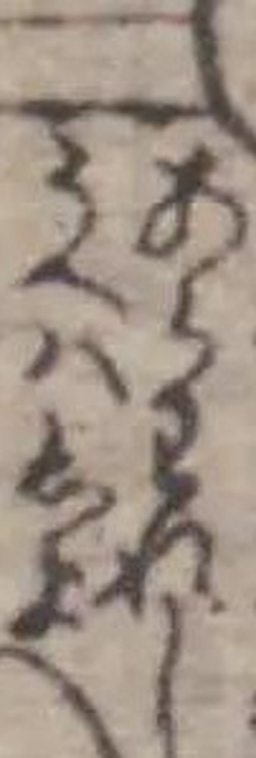うへはしよ
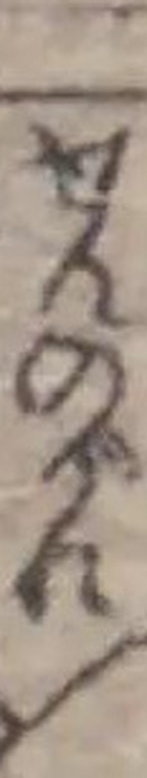せんのがれ
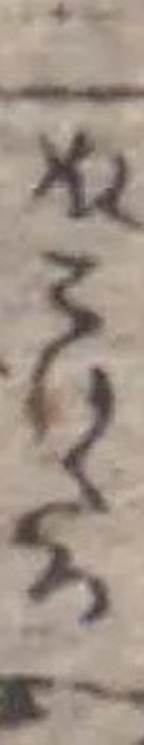ぬこけたか
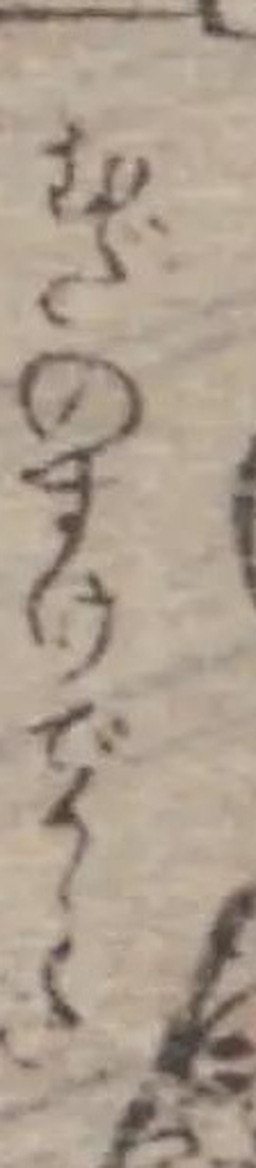むだのすけでかした
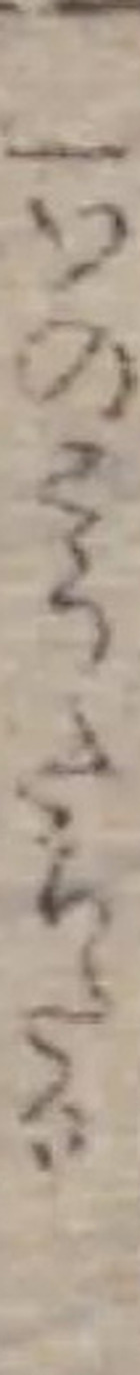一つのこうたちたる
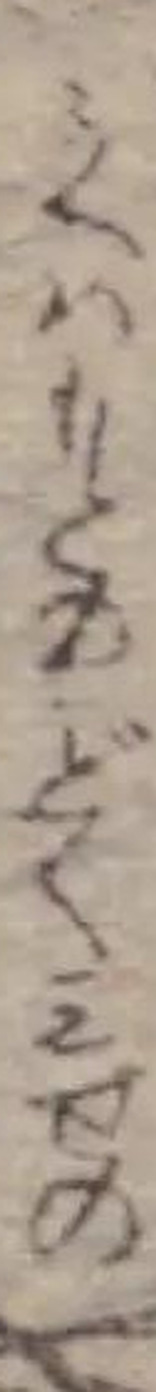うへはもとのごとく三せの
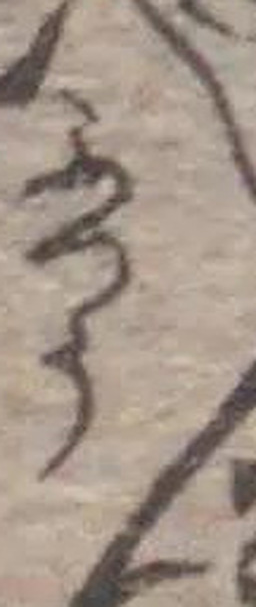ふつう
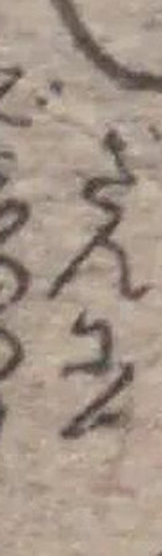もんに
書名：富多高慢噺 3巻
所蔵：国立国会図書館 National Diet Library, JAPAN
